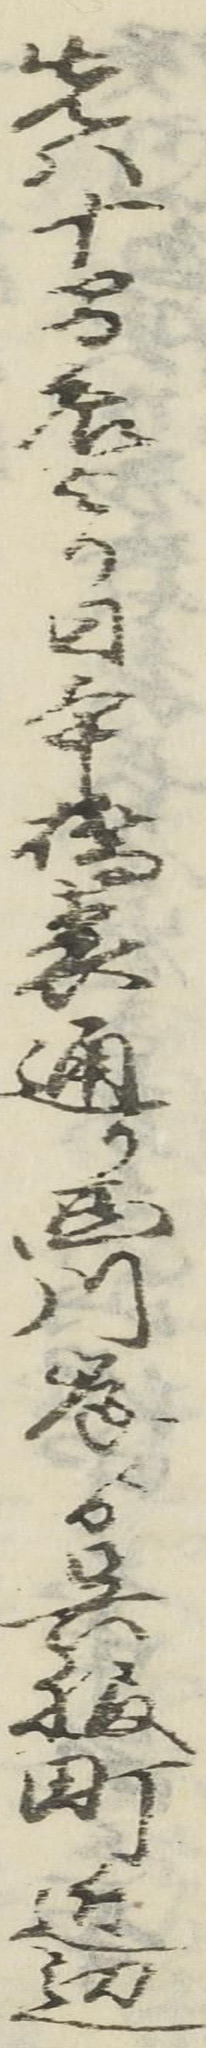先は十間店より日本橋裏通り西川岸ゟ呉服町近辺
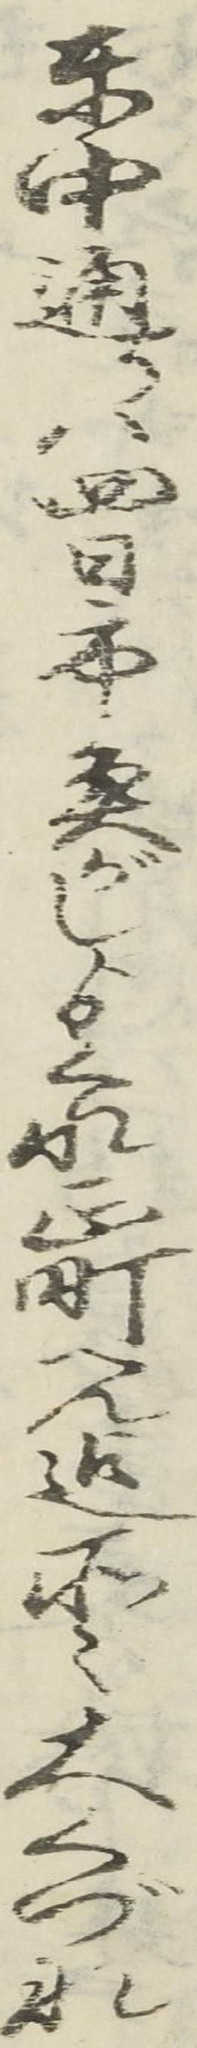東中通りは四日市魚がしゟくれ正町へん迄所々大くづれ
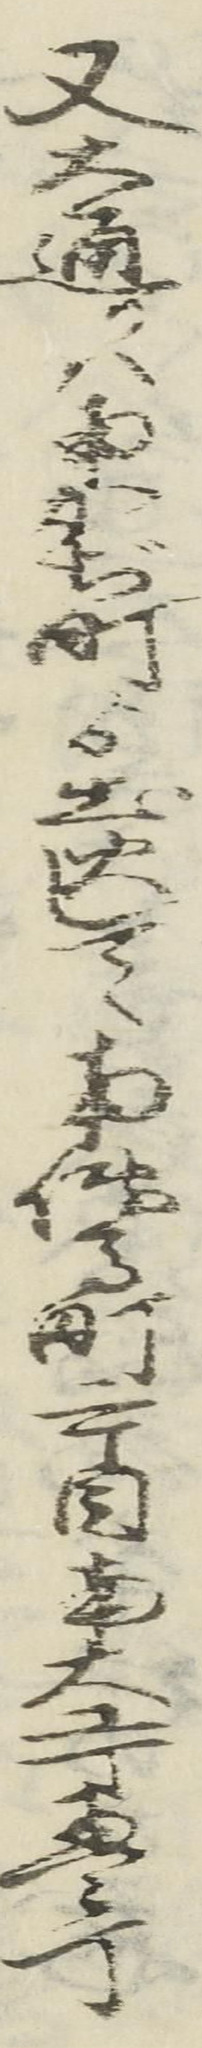又大通りは南かぢ町ゟ出火して南伝馬町二丁目南大工丁畳丁
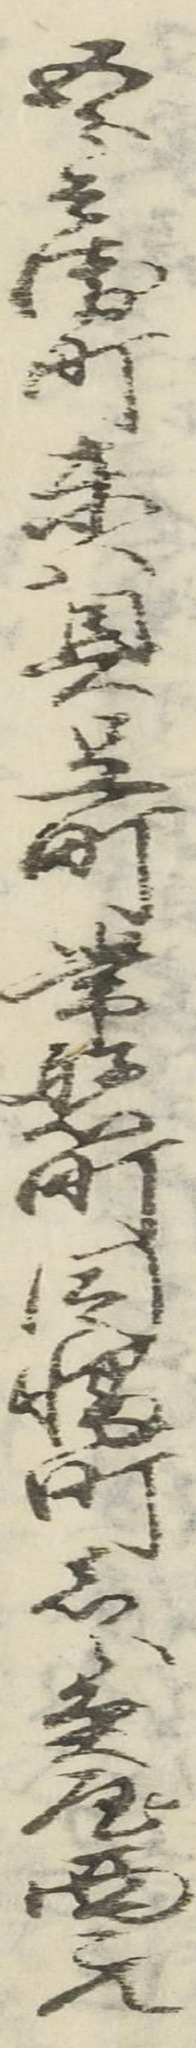五郎兵衛町東は具足町常磐町因幡町しら魚屋西こん
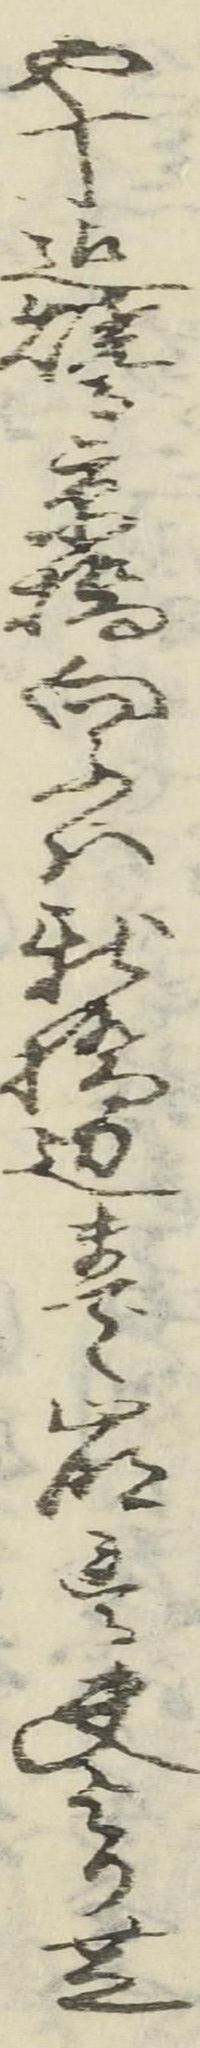や丁迄焼る京橋向ふは新橋辺まで崩れる夫より芝
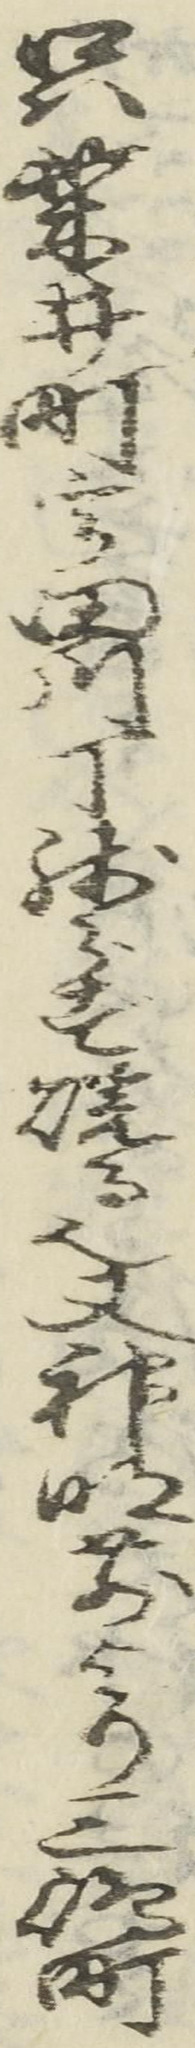口は柴井町宇田川丁残らず焼る也又神明前より三嶋町
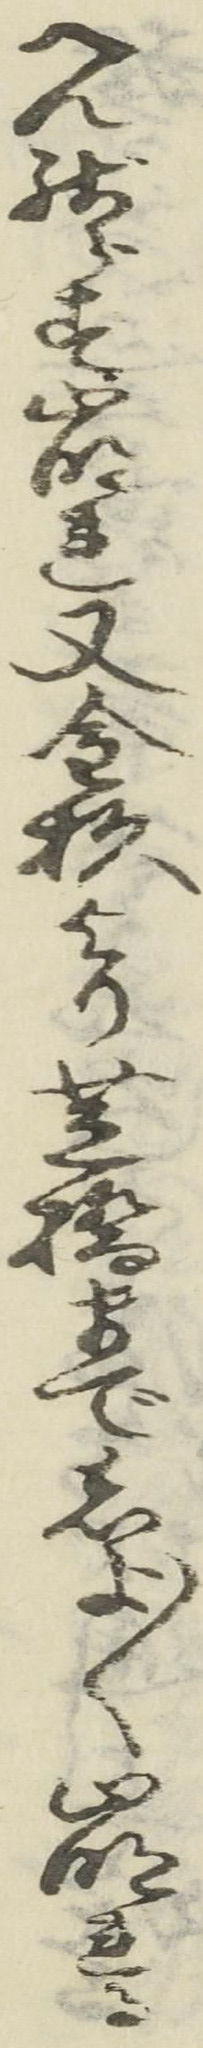へん残らす崩れ又金杉より芝橋までしよ〳〵崩れる
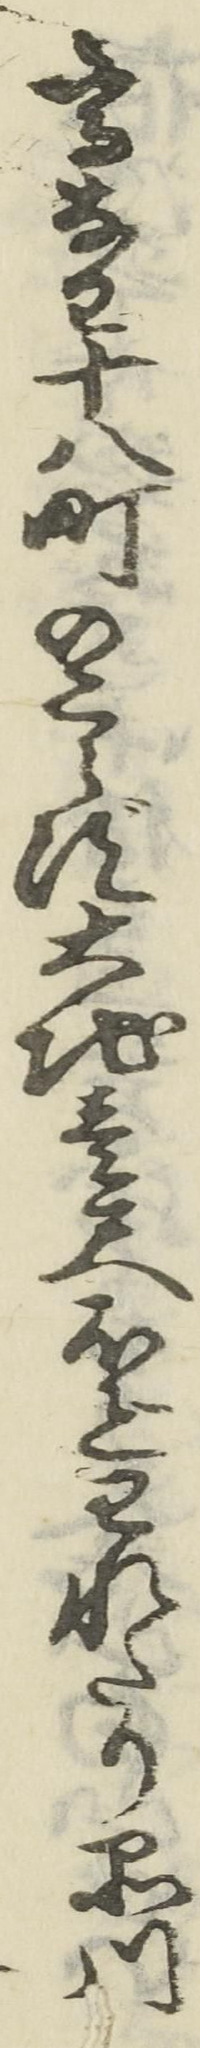高なわ十八町のこらず大地壱尺ほどわれたり品川
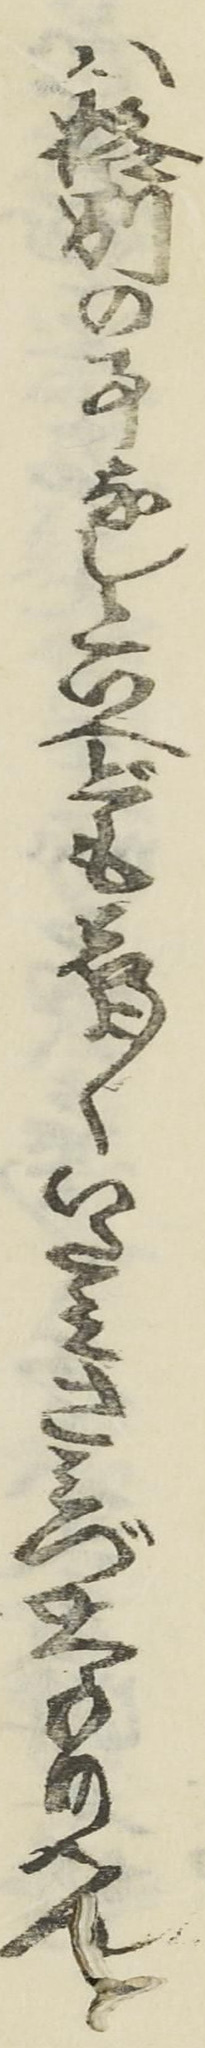は格別の事なしといへどもしよ〳〵いたみさみづ大手のへん
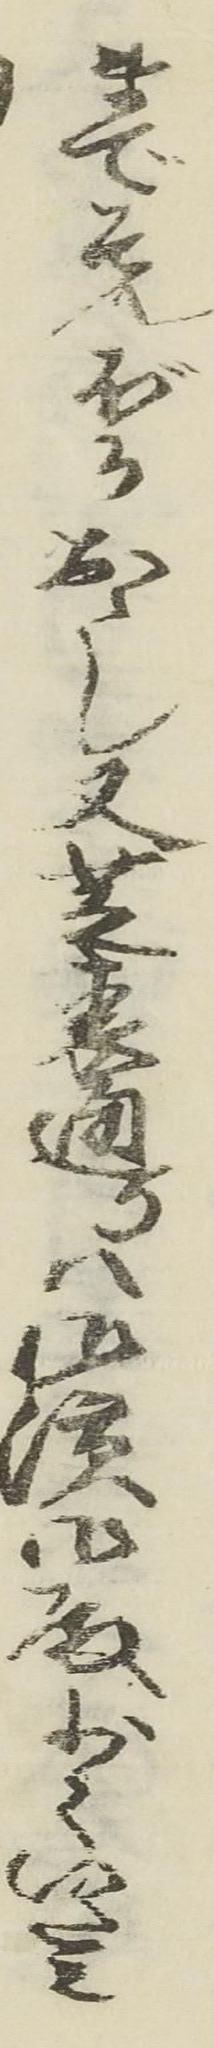までそんぼうおゝし又芝裏通りは御浜御殿少々いたみ
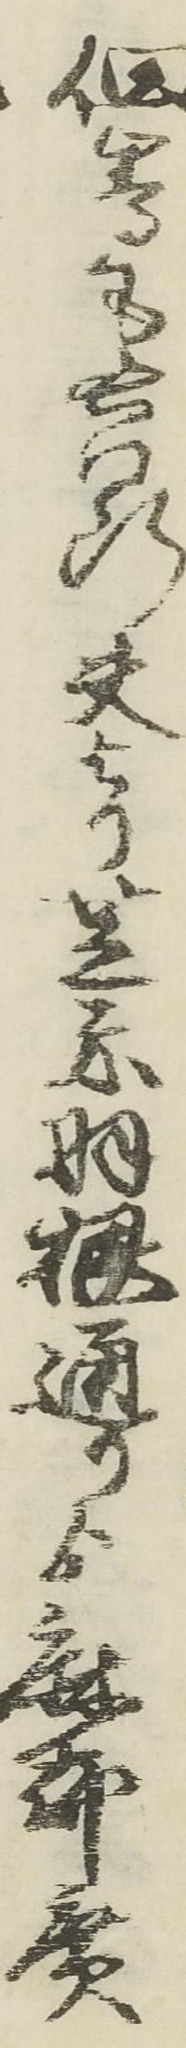佃島も右同断夫より芝赤羽根通りゟ麻布広
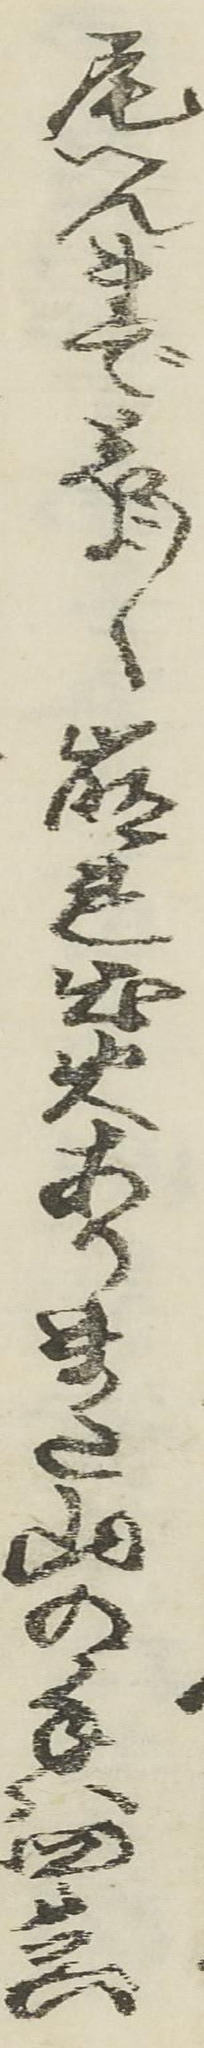尾へんまでしよ〳〵崩れ出火ありまた山の手は四谷
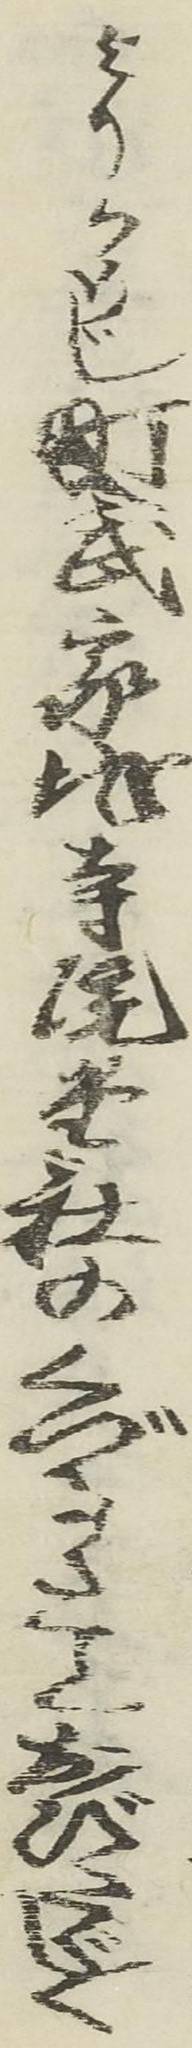よりかうじ町武家地寺院堂社のくづるゝことおびたゞしく
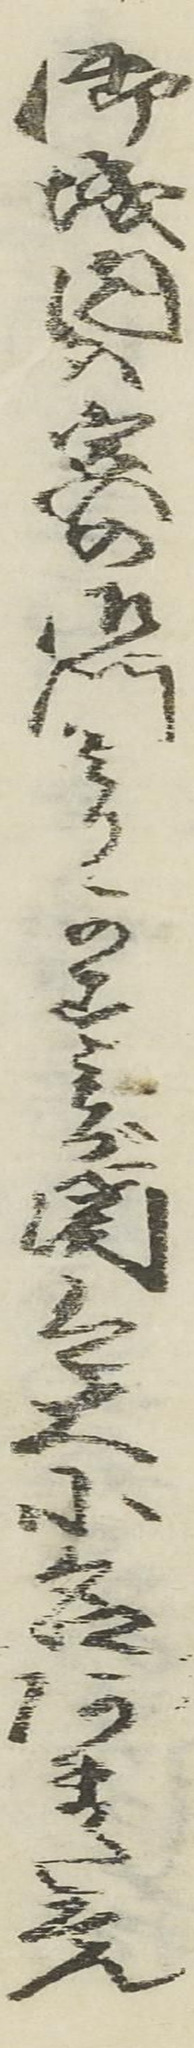御城内は寅の御門よりかすみが関は大小名あまたそん
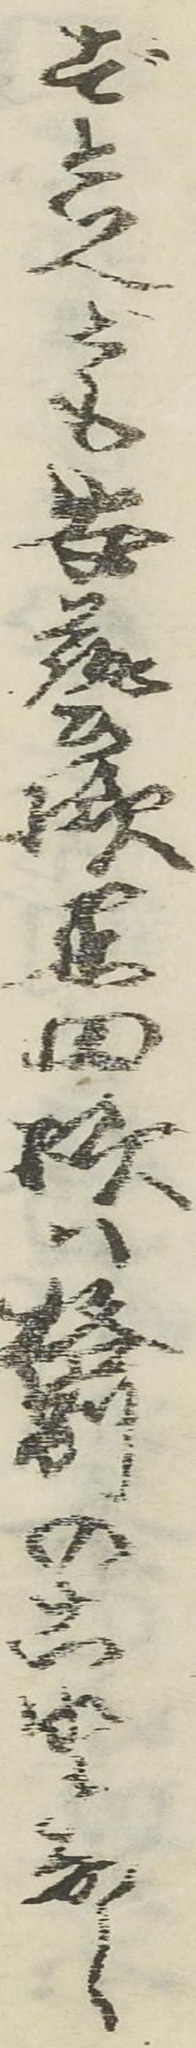ずといへども安芸様黒田様は格別のことなし
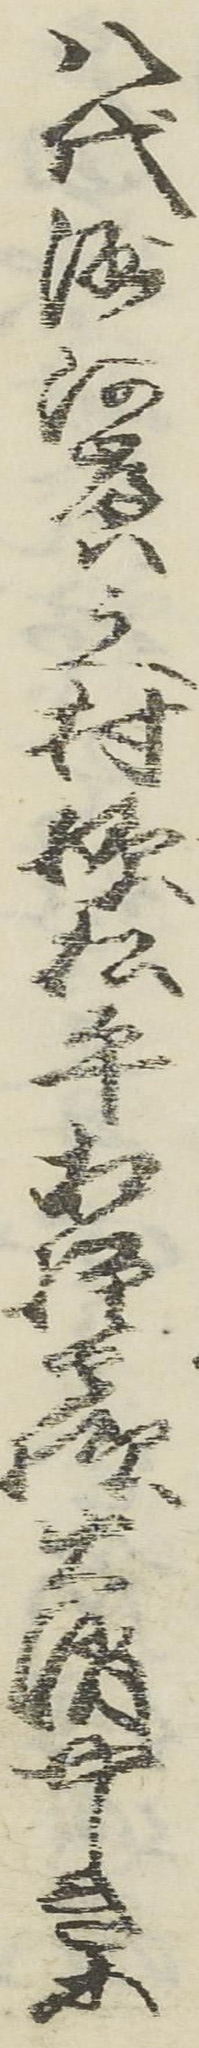八代堀河岸はうへ村様松平相模守様火消やしき等
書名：安政乙卯江戸大地震筆記　安政丙辰八月大阪大雷雨之記追加　安政三辰年七月松前辺大地震并八月大風雨記録
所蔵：東京大学地震研究所図書室 Earthquake Research Institute Library, The University of Tokyo, JAPAN
